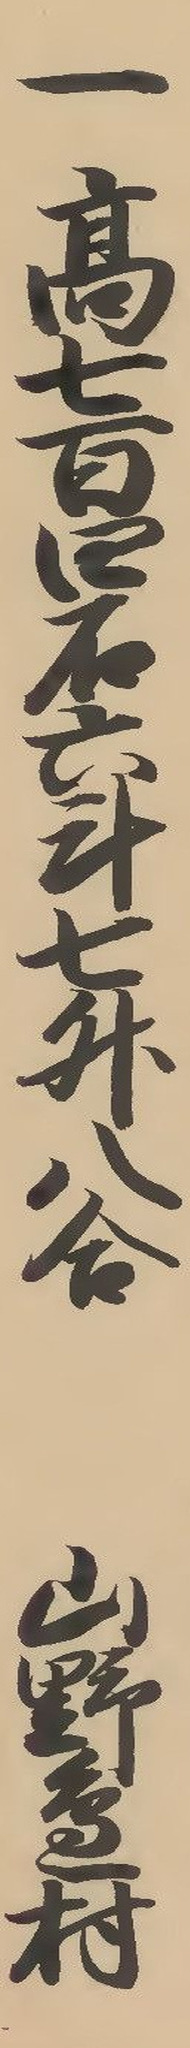一高七百四石六斗七升八合山野辺村

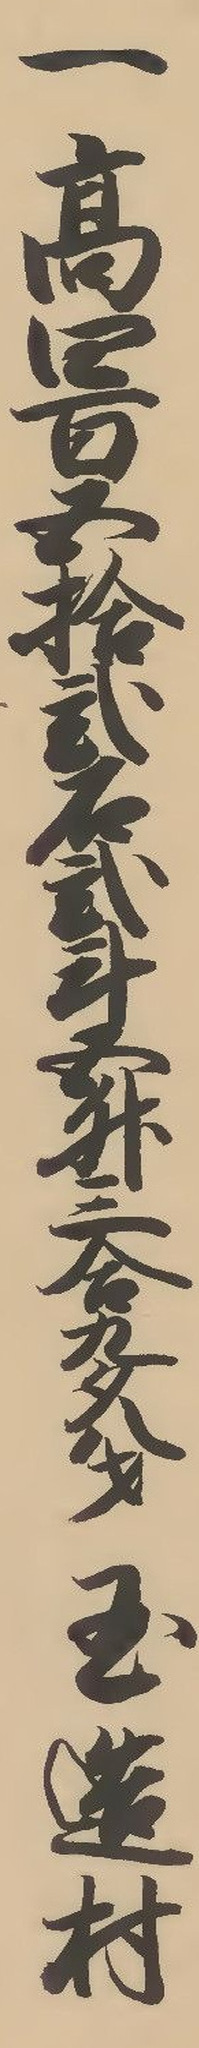一高四百五拾弐石弐斗五升三合九勺八才玉造村
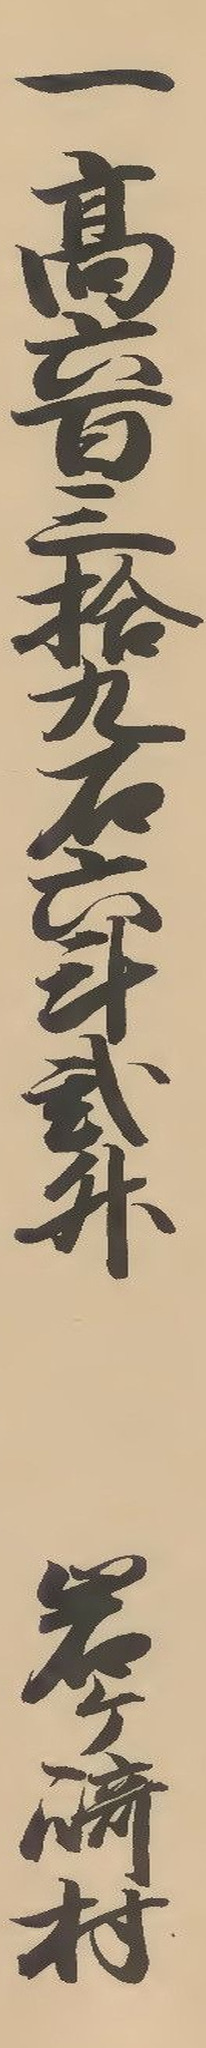一高六百三拾九石六斗弐升岩ヶ崎村
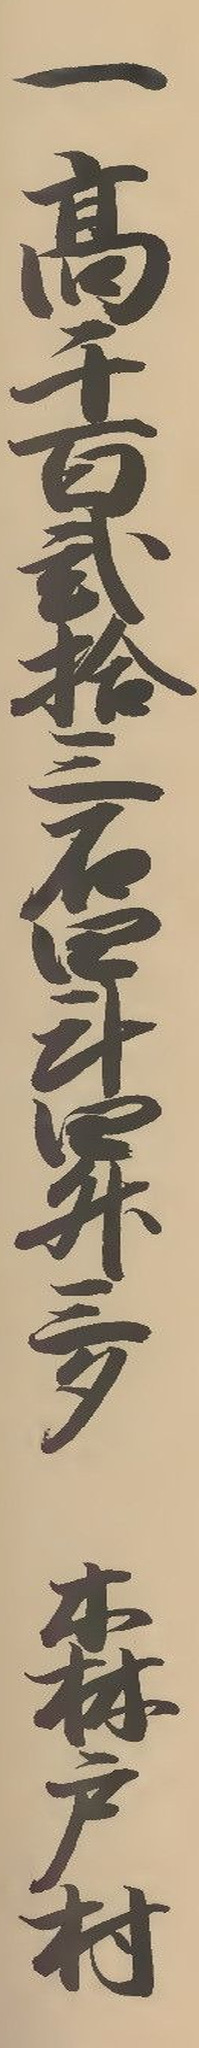一高千百弐拾三石四斗四升三勺森戸村
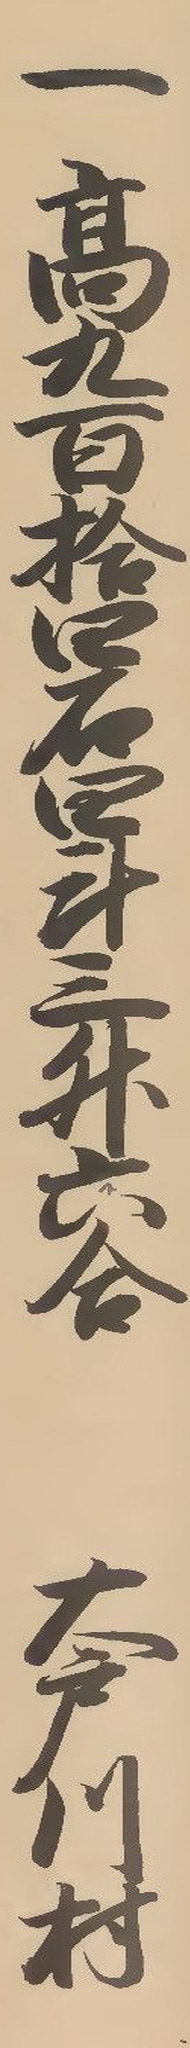一高九百拾四石四斗三升六合大戸川村
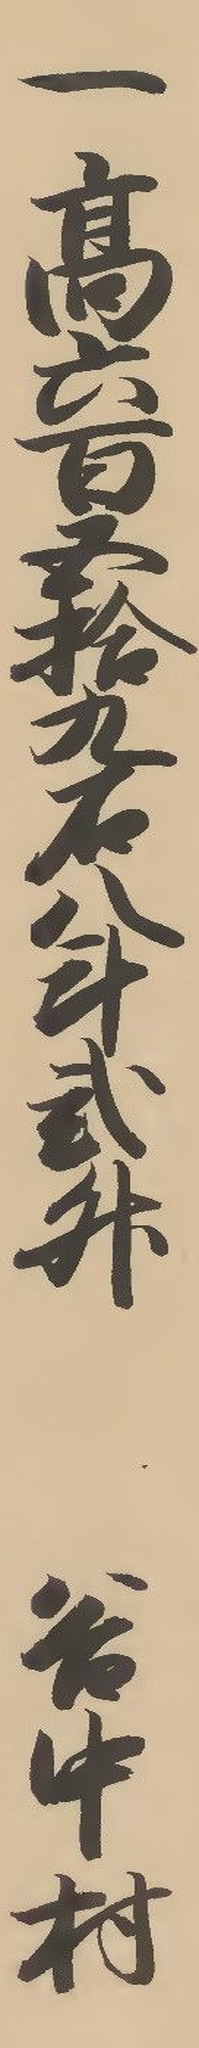一高六百五拾九石八斗弐升谷中村
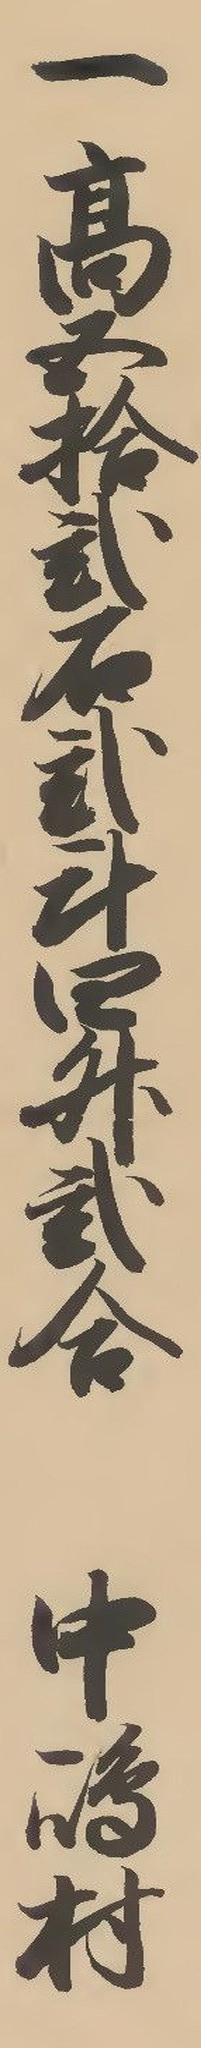一高五拾弐石弐斗四升弐合中島村
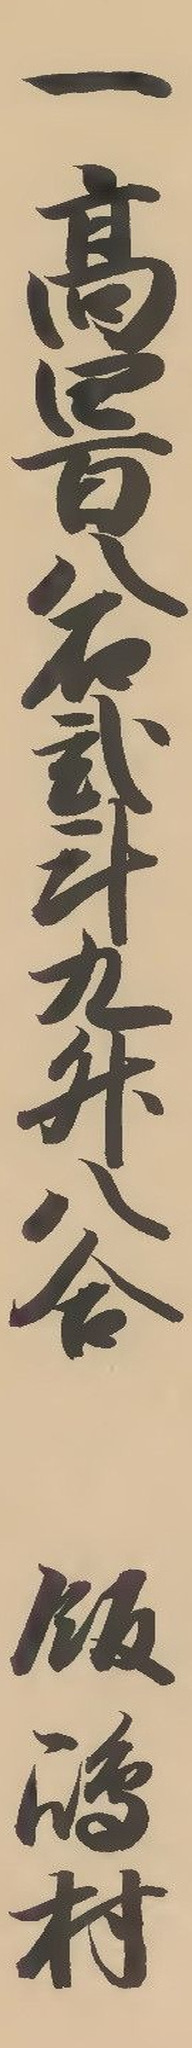一高四百八石弐斗九升八合飯島村

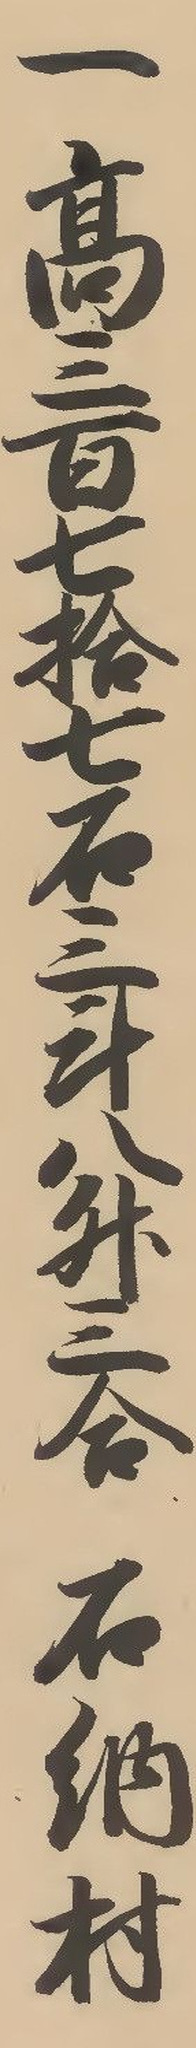一高三百七拾七石三斗八升三合石納村
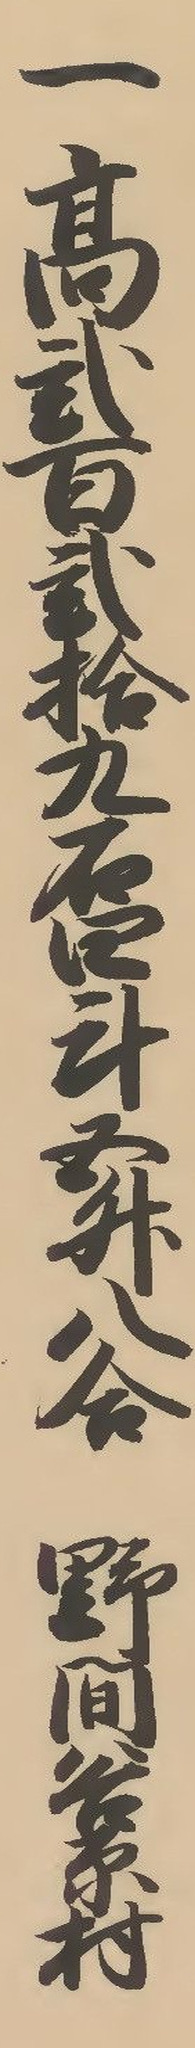一高弐百弐拾九石四斗五升八合野間谷原村
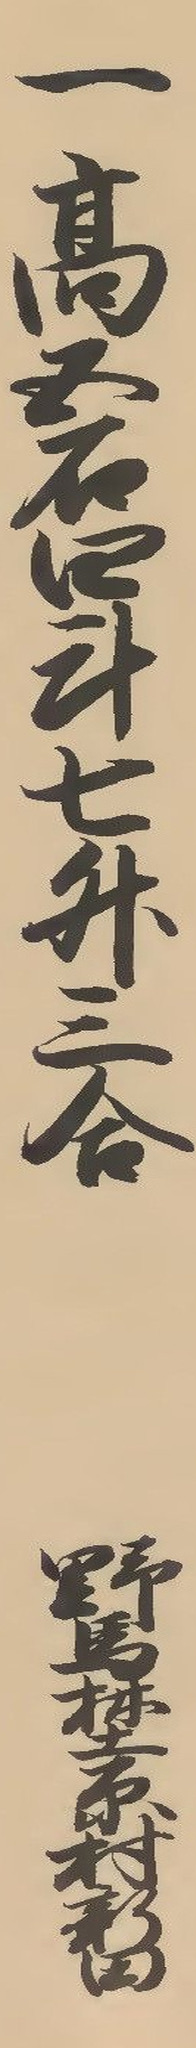一高五石四斗七升三合野馬埜原村新田
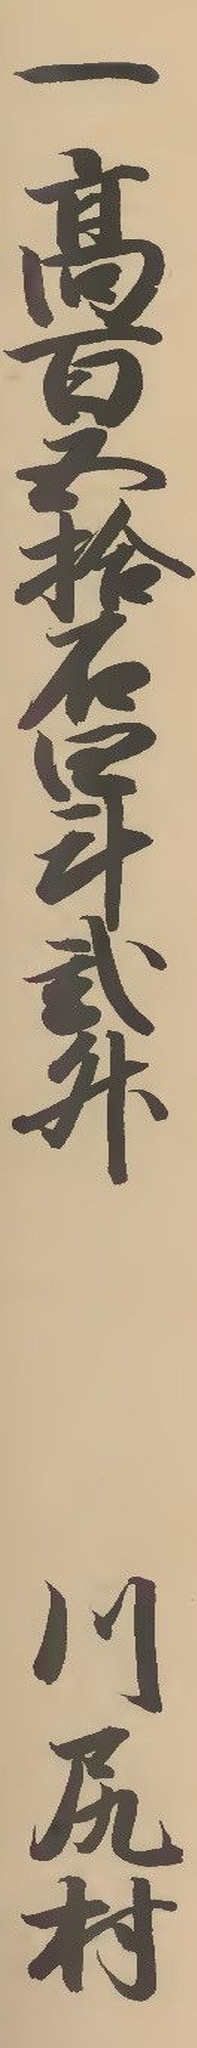一高百五拾石四斗弐升川尻村
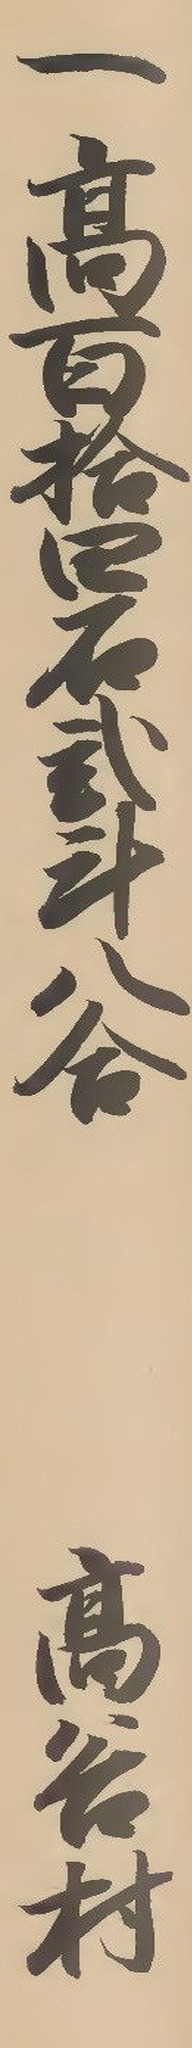一高百拾四石弐斗八合高谷村
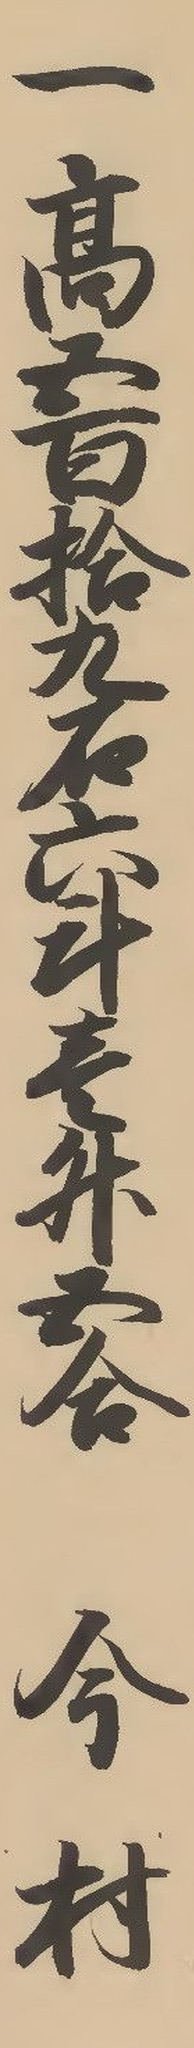一高五百拾九石六斗壱升五合今村
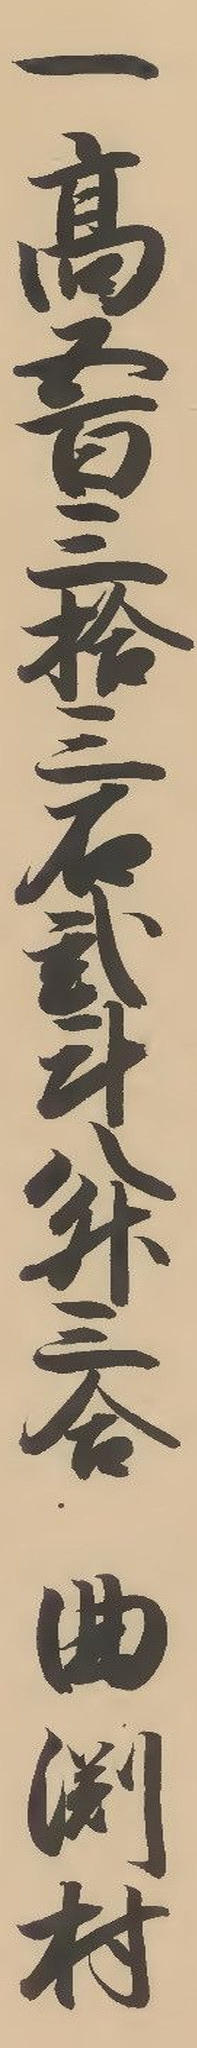一高五百三拾三石弐斗八升三合曲渕村
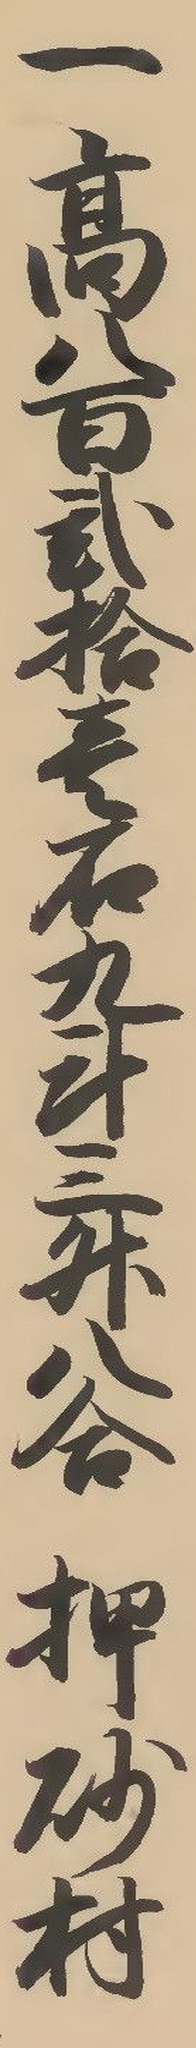一高八百弐拾壱石九斗三升八合押砂村
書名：下総国郷帳
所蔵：国立公文書館 National Archives of Japan
